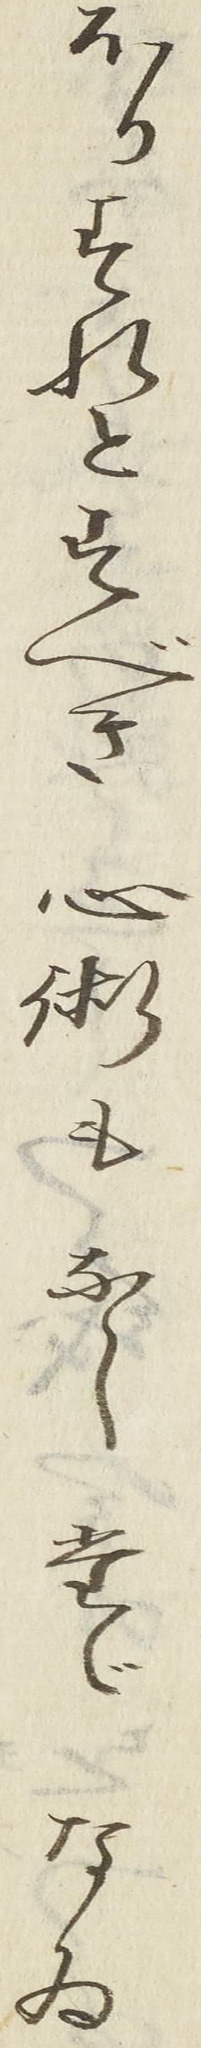ほりすれとすべき心術もなしたゞなゐ
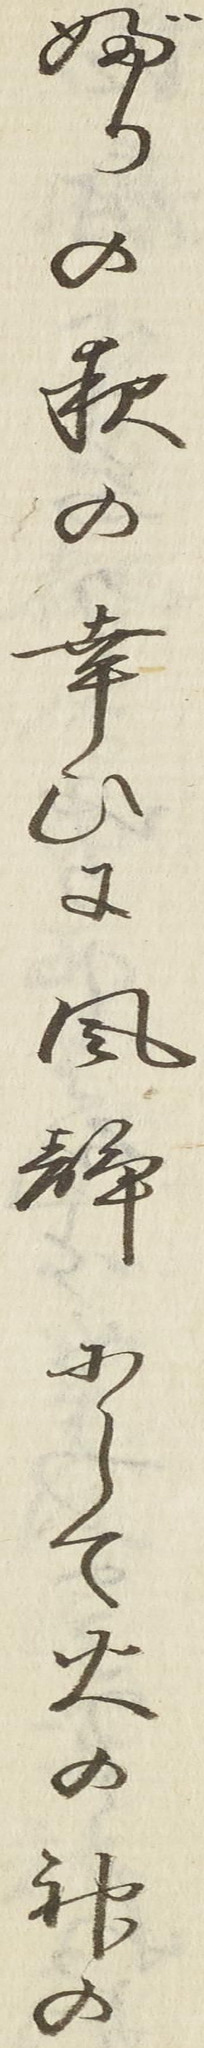ぶりの夜の幸ひに風静にして火の神の
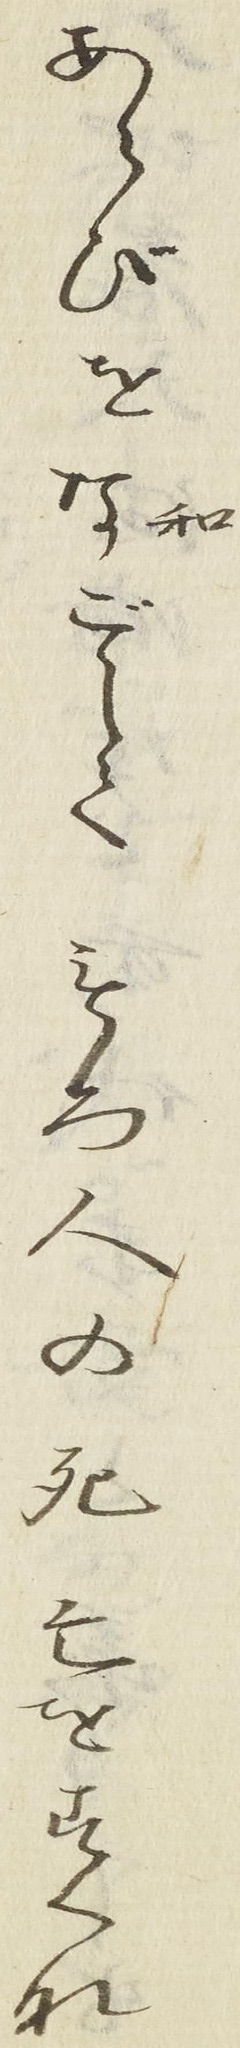あらびをなご和してもろ人の死亡をすくな
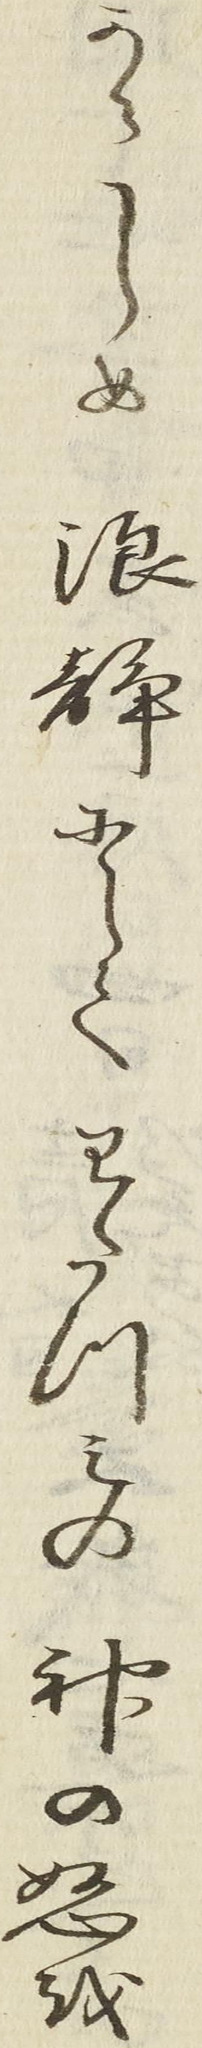からしめ浪静にしてわたつみの神の怒を
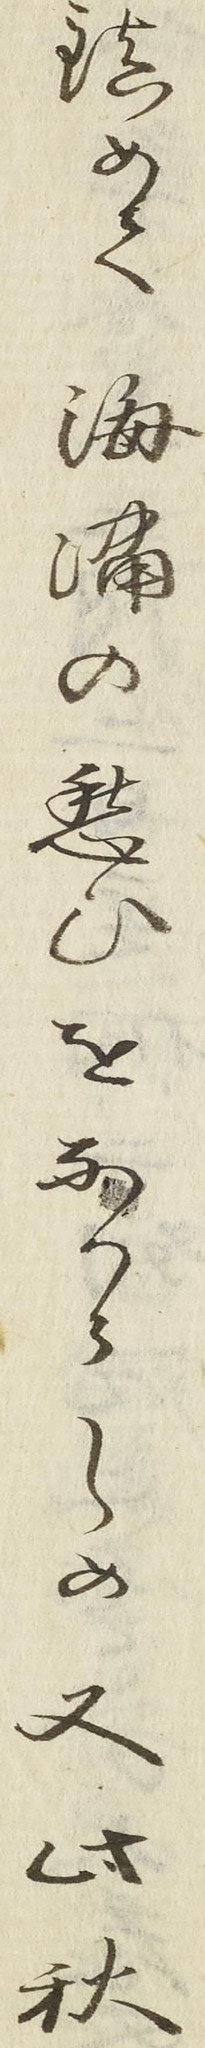鎮めて海浦の愁ひをなからしめ又此秋
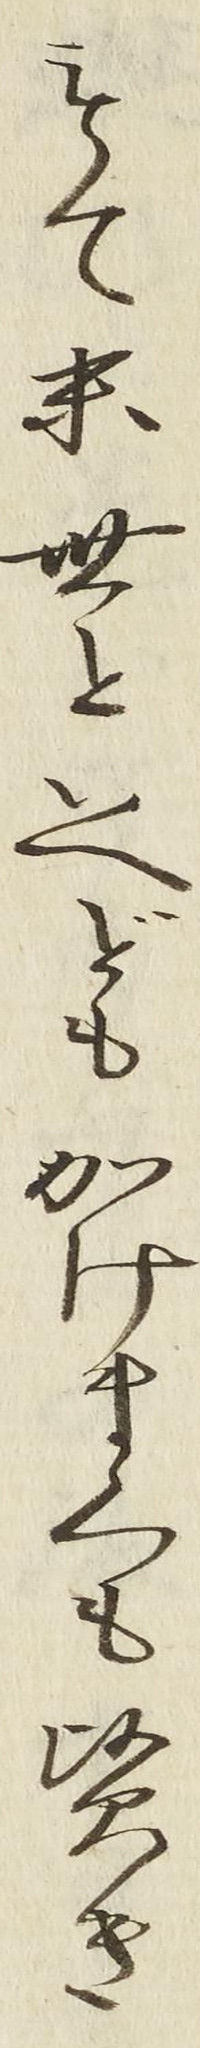もて末世といへどもかけまくも賢き
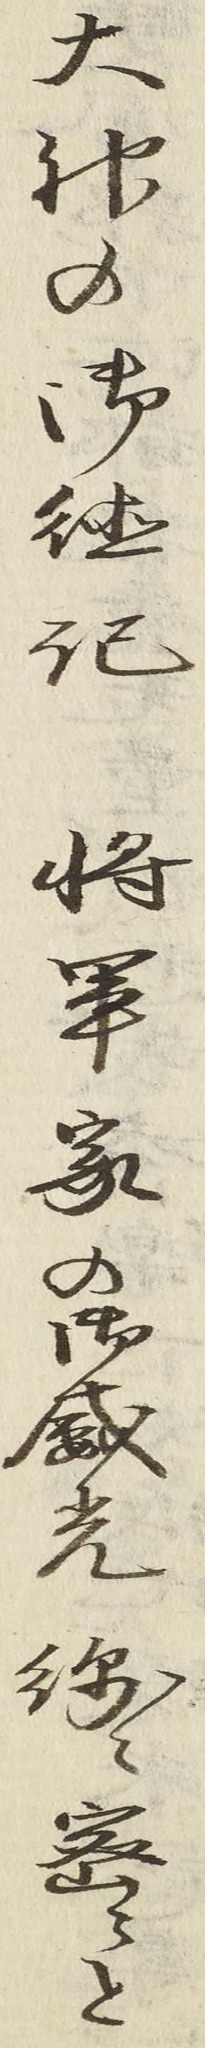大神の御徳記将軍家の御威光綿〻密〻と
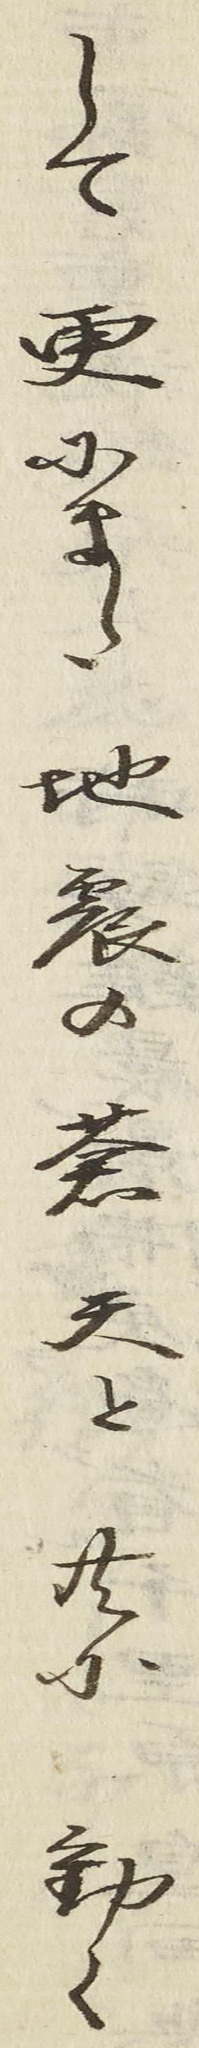して更にまた地震の蒼天と共に動く
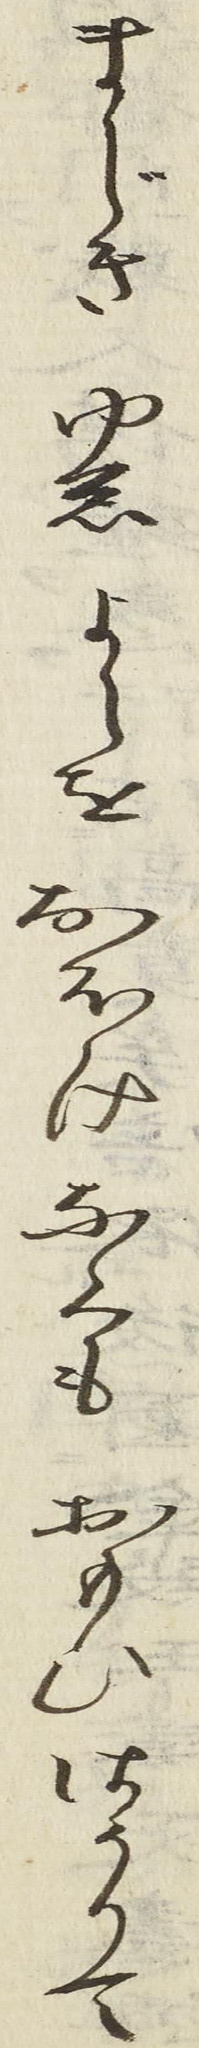まじきゆゑよしをおほけなくもおもひはかりて
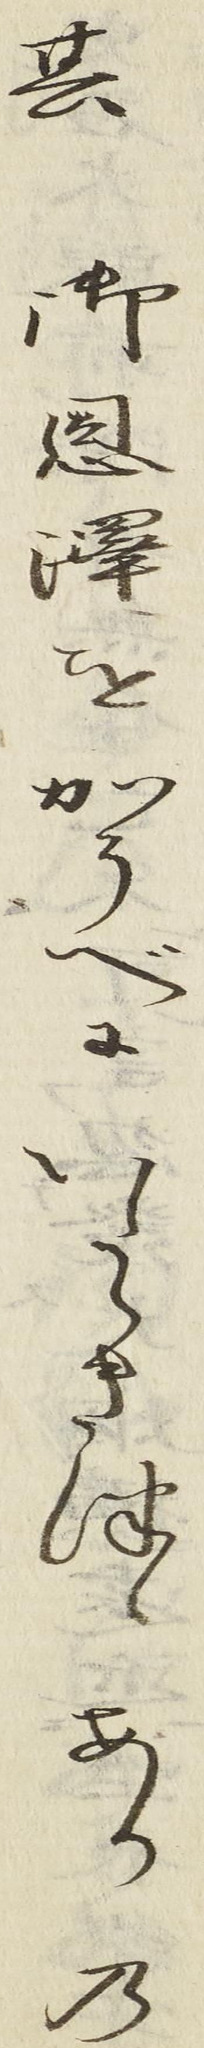其御恩沢をかうべにいたゝきつゝありの
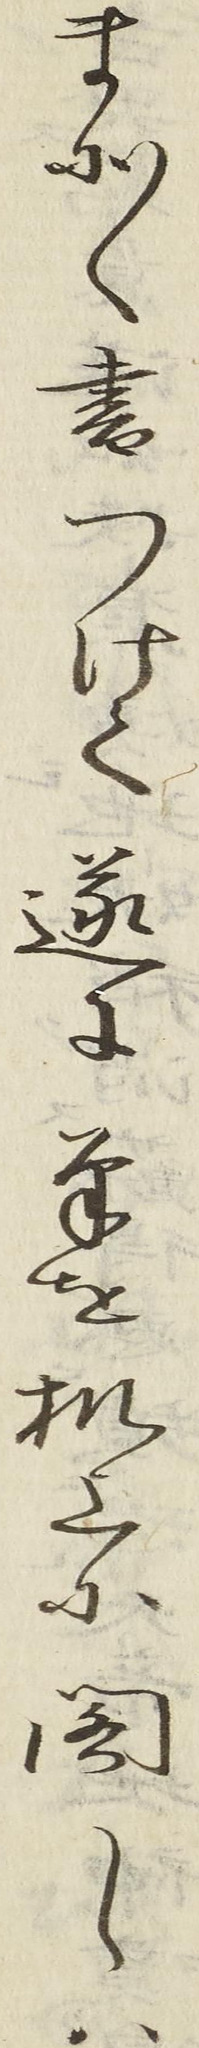まに〳〵書つけて遂に筆を机上に閣しは
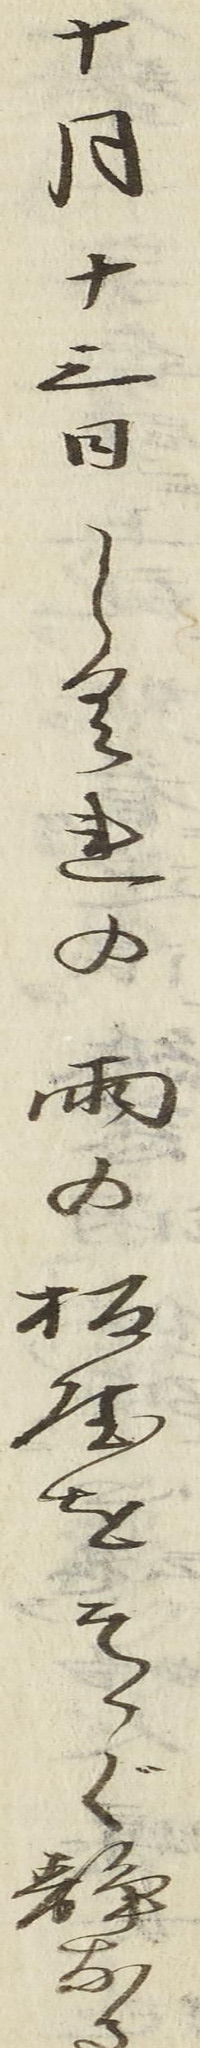十月十三日しくれの雨の板屋をそゝぐ静なる
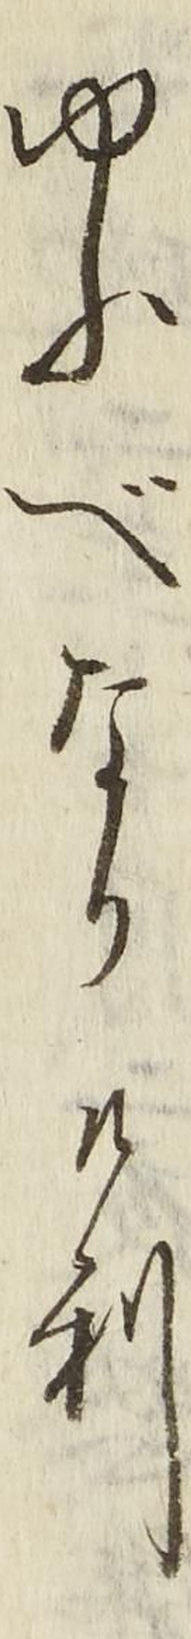ゆふべなりけり

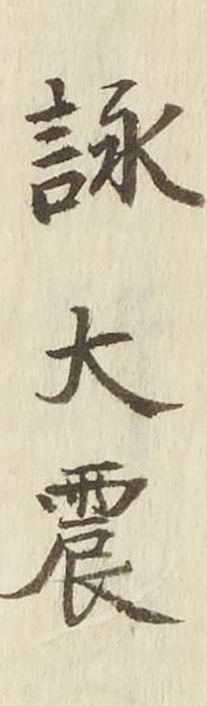詠大震
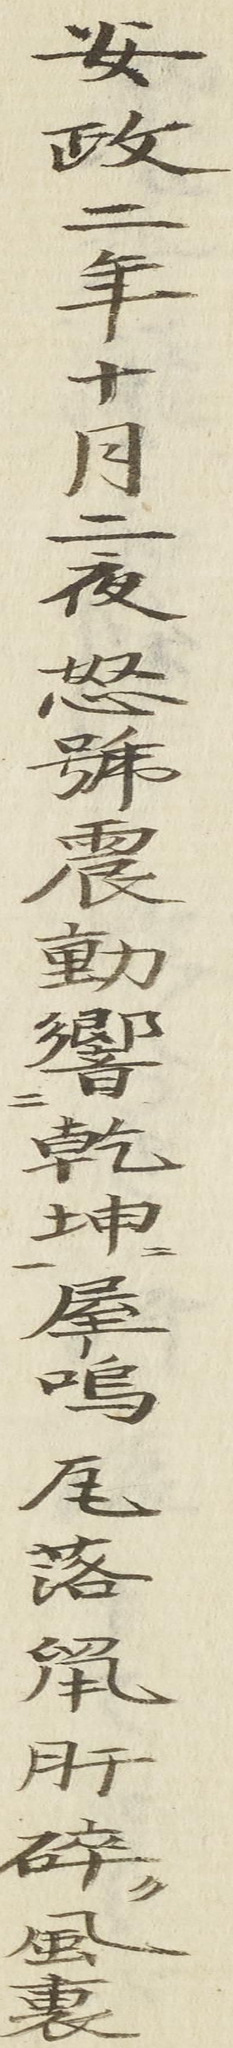安政二年十月二夜怒號震動響乾坤屋-鳴瓦落鼡肝砕風裏
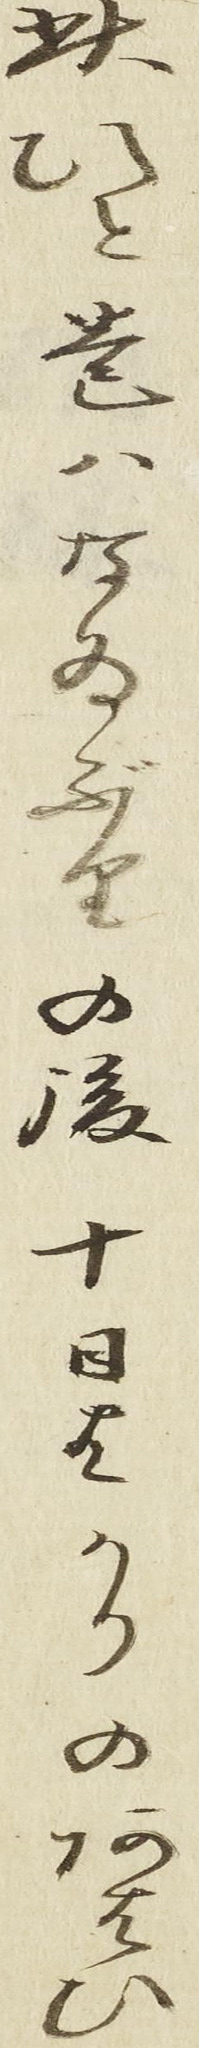此ひと巻はなゐぶりの後十日はかりのあはひ
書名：やぶれ窓の記　全
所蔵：東京大学地震研究所図書室 Earthquake Research Institute Library, The University of Tokyo, JAPAN
